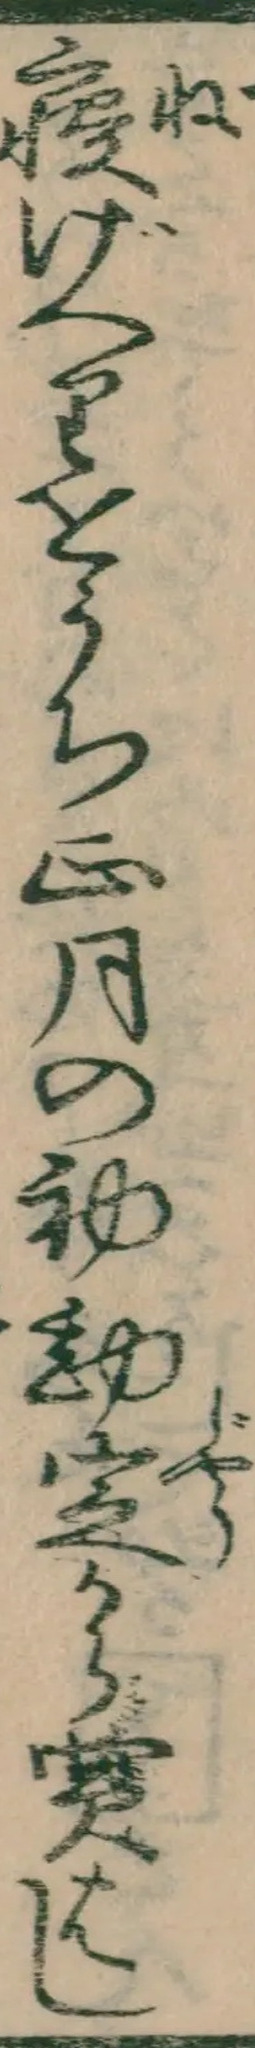寝げへりをうち正月の初勘定から買はし
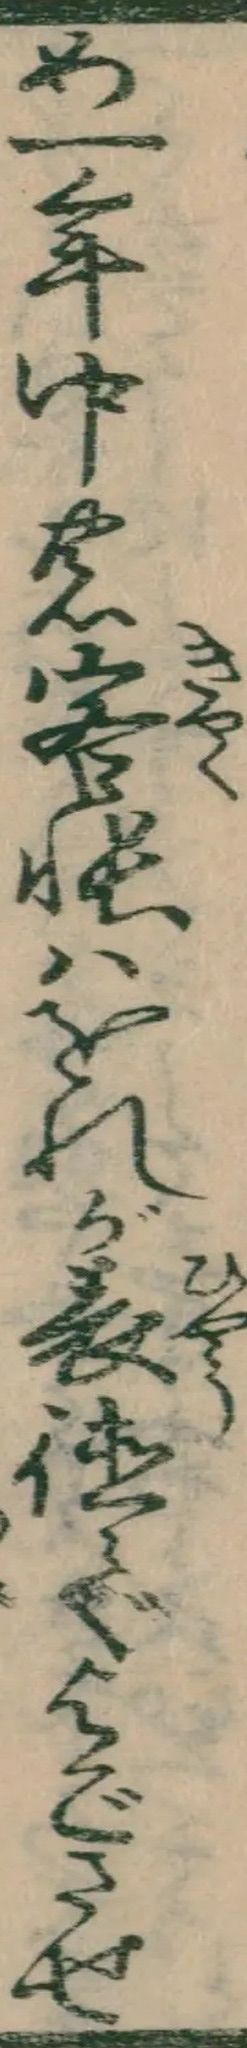め一年中の客帳はをれが表徳でよごさせ
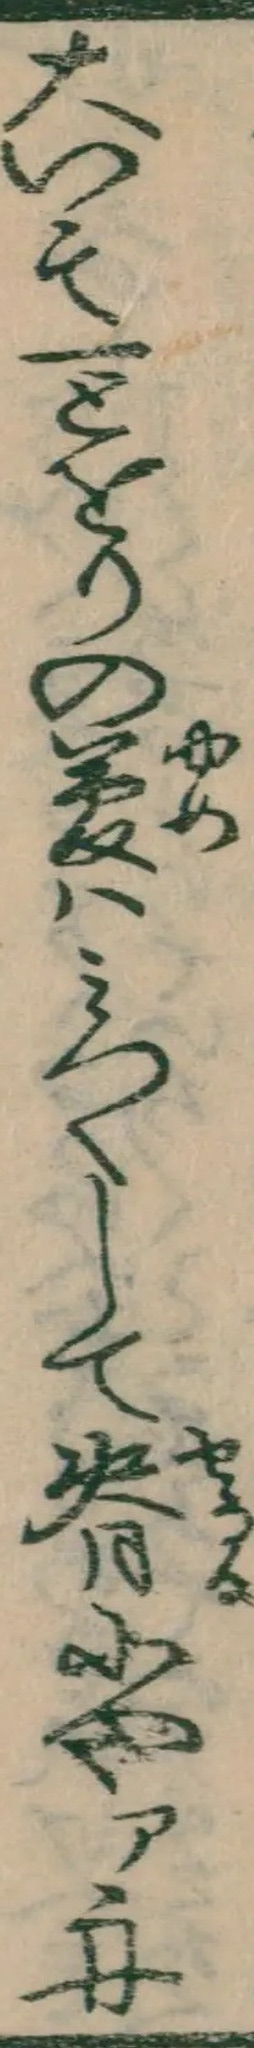大いも一とをりの夢はみつくして背にやァ舟
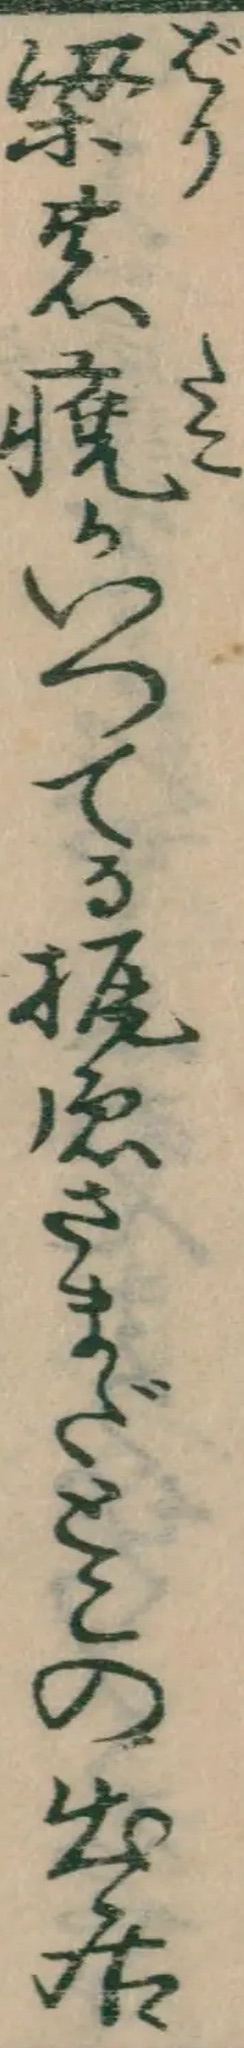梁の瘣かいつてる梶原さまだとこの出居
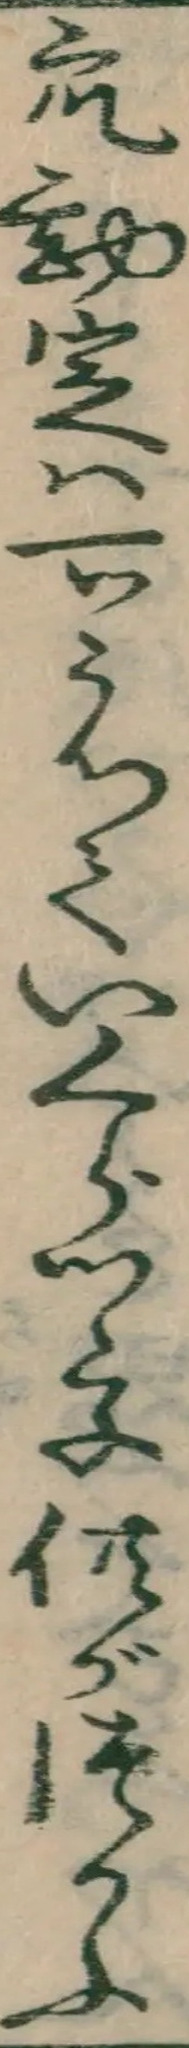衆勘定は一つうつていくらつゝ子供がつかふ
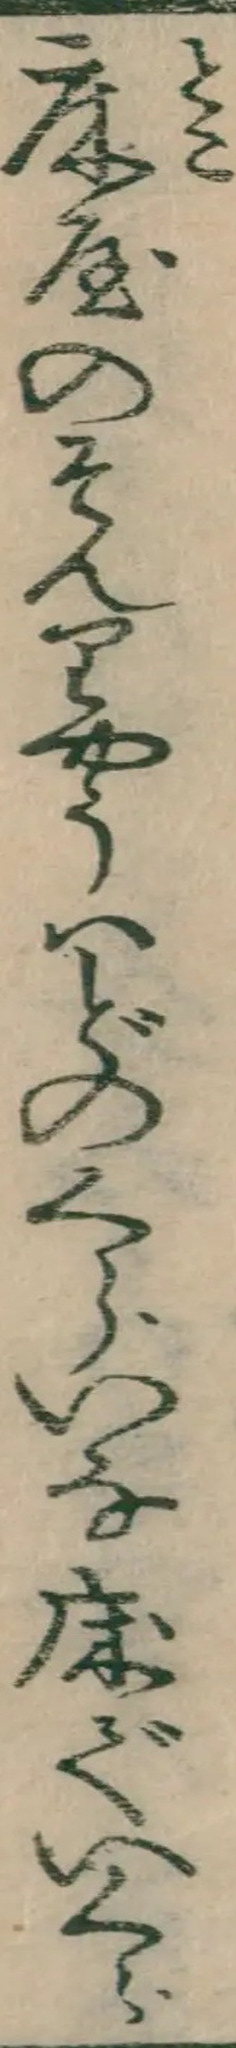床屋のそんりやうはどのくらいな床でいくら
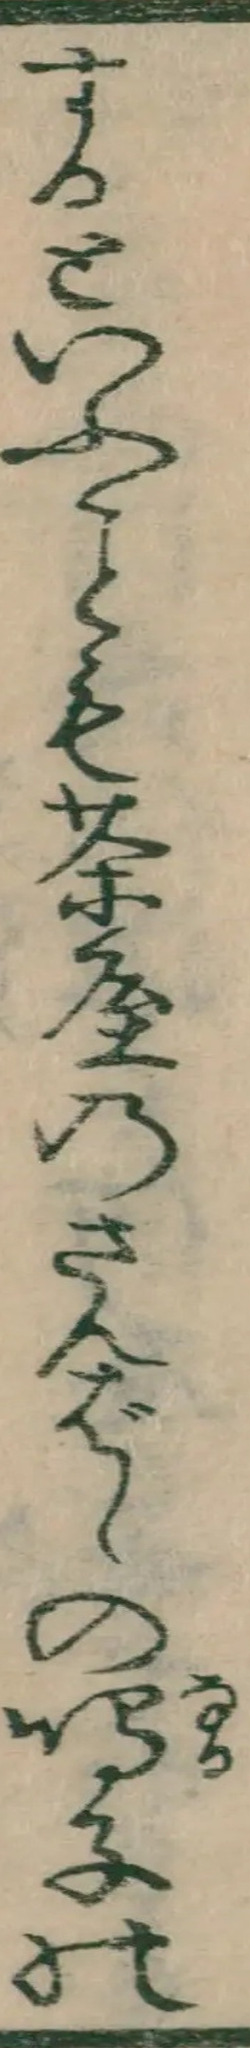するといふことも茶屋のさんばしの鳴子の

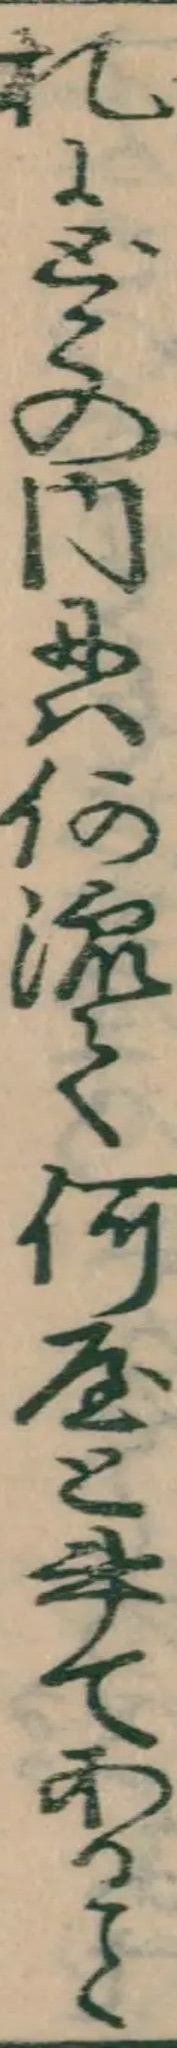札にどこの内には何流て何屋と書てあること
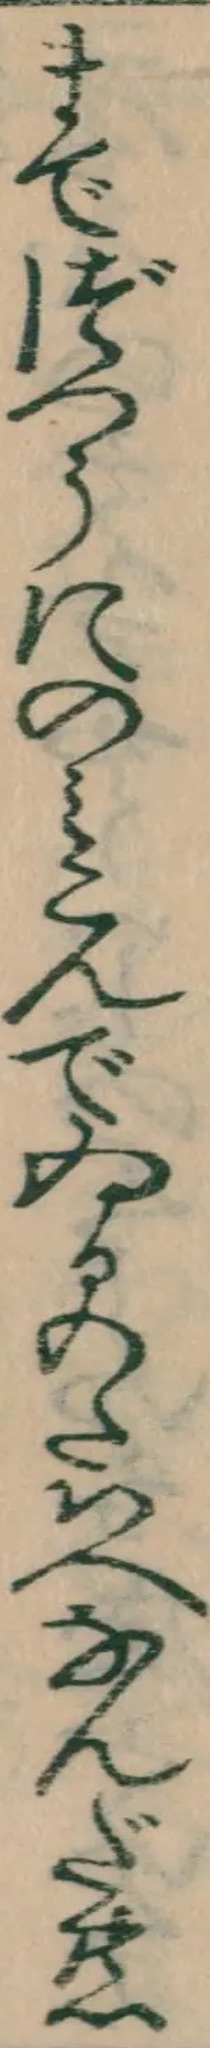までづつうにのみこんでゐるのたはへなんだの
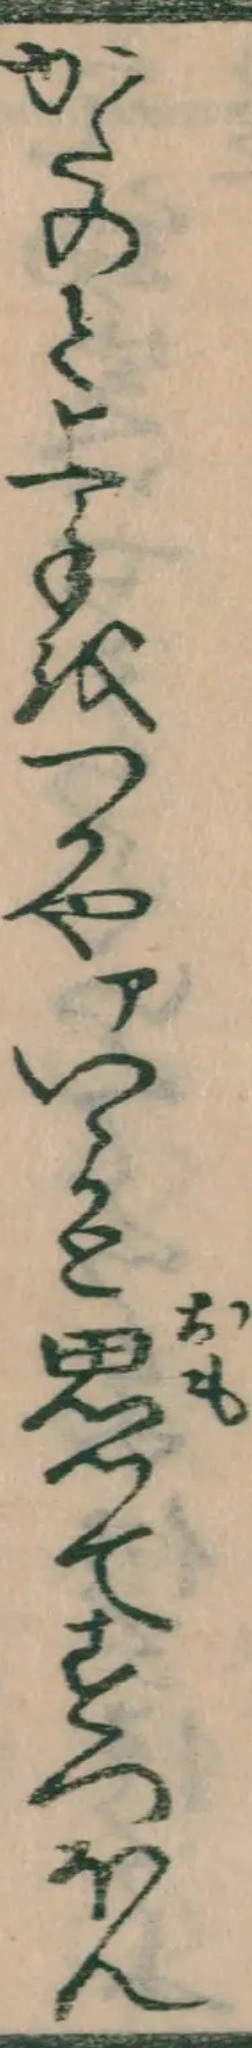かたのと上手をつかやァいゝかと思つてすつほん
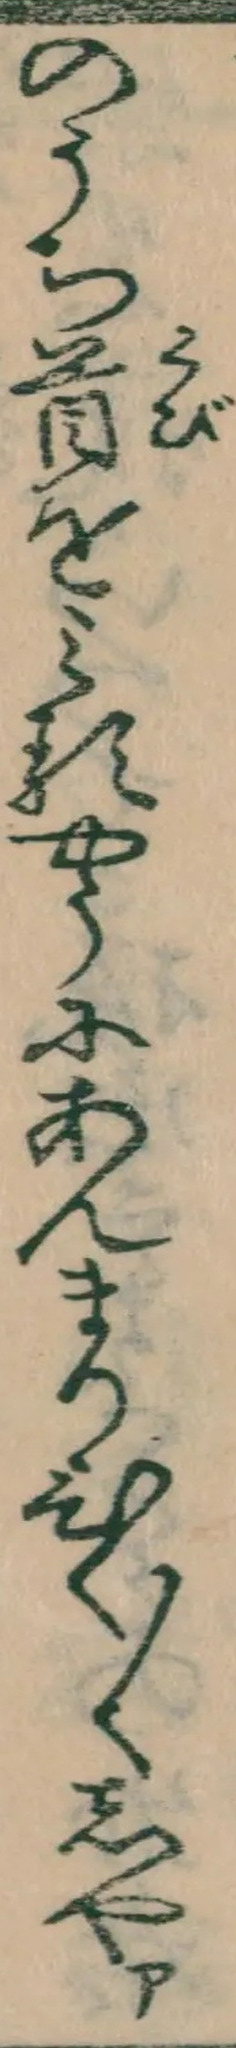のうち首をみるやうにあんまりひく〳〵しやァ
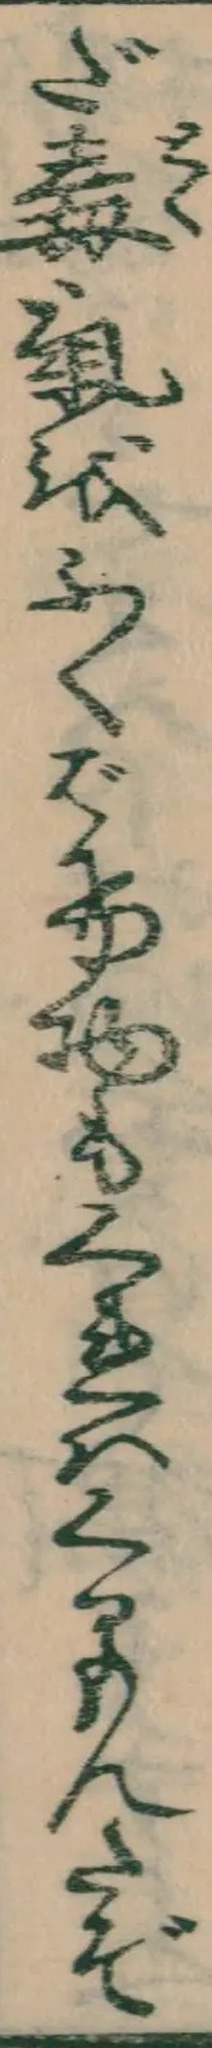だ毒気をふくばけ物もくれはくるもんたぞ
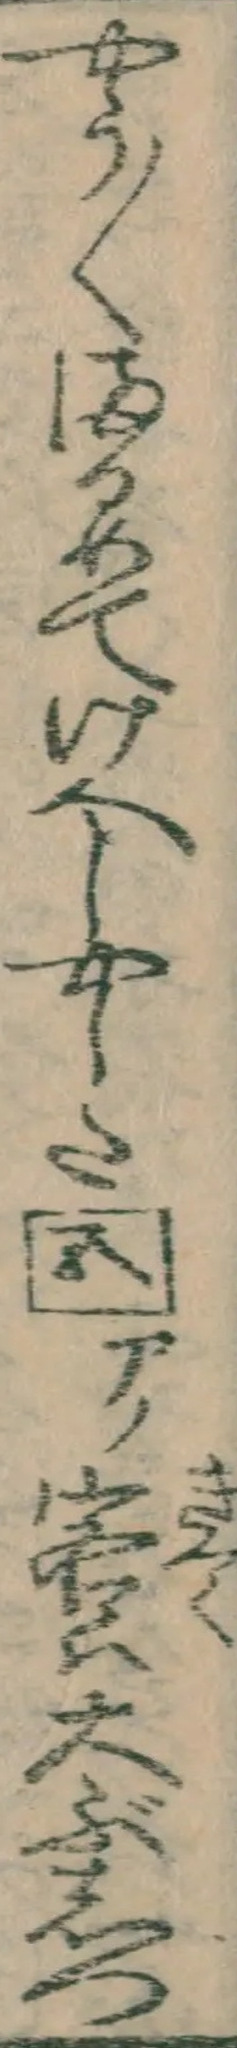やう〳〵まるめてけへしやした〈五〉アノ客は大ぶしつ
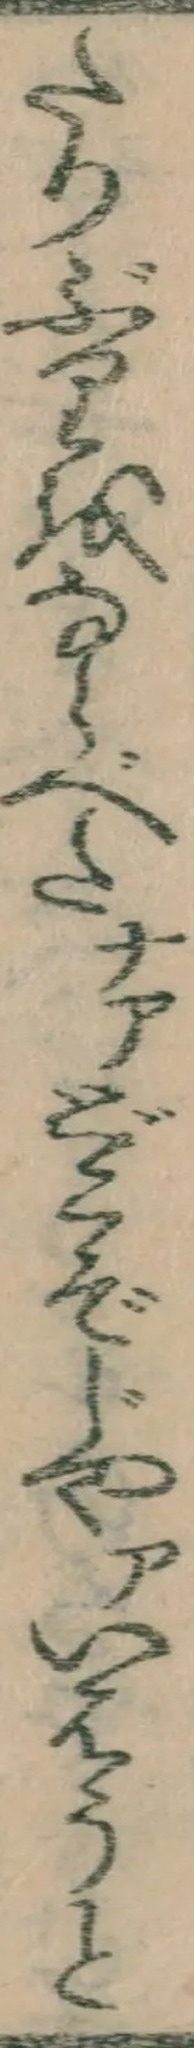たかぶりをならべたナアどこぞじやァいはうと
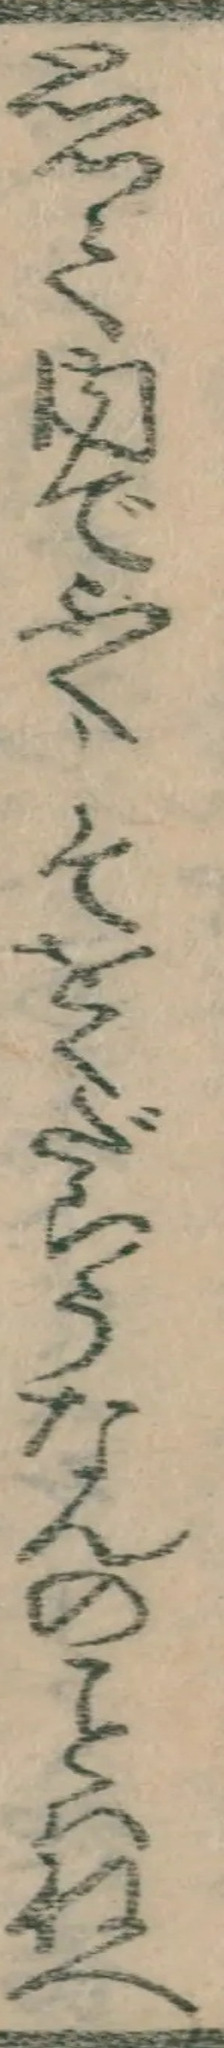思つて内でふくしてをくだらうなんのことはねへ
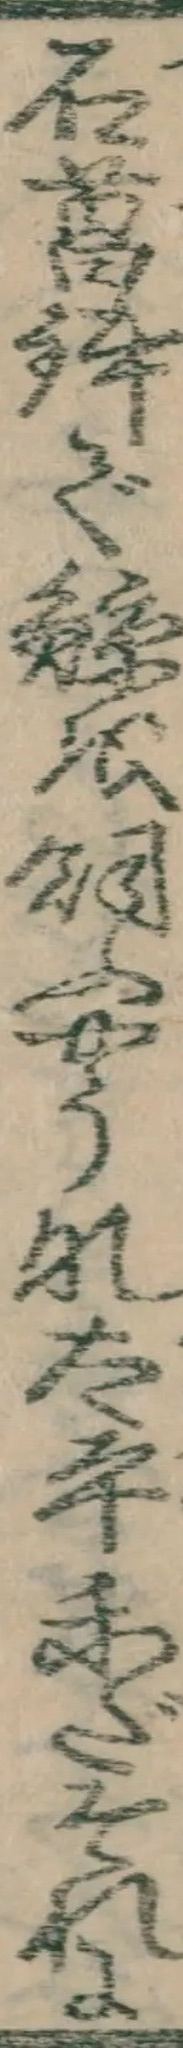石菖鉢で鯨を飼ふやうな太平楽だそれに
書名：教訓読本：大礒風俗仕懸文庫
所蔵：国立国会図書館 National Diet Library, JAPAN
